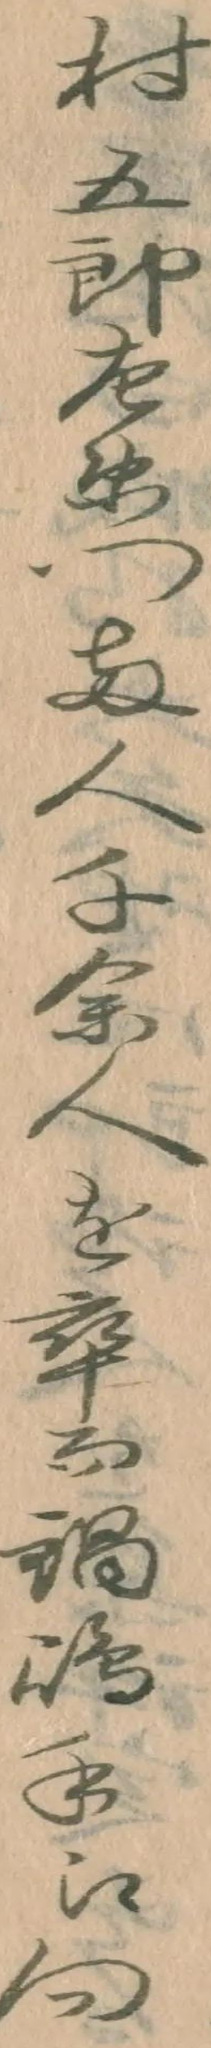村五郎左衛門両人千余人を率而鍋島手江向
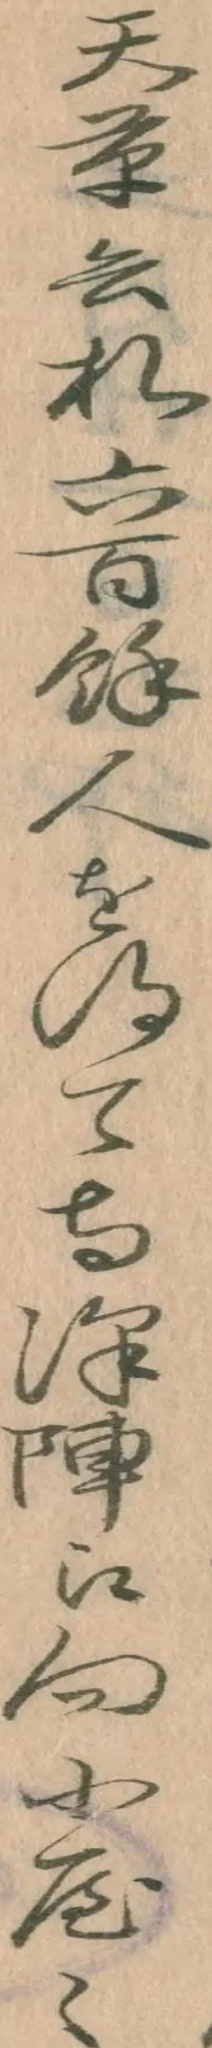天草兵札六百余人を得て寺沢陣江向小屋之
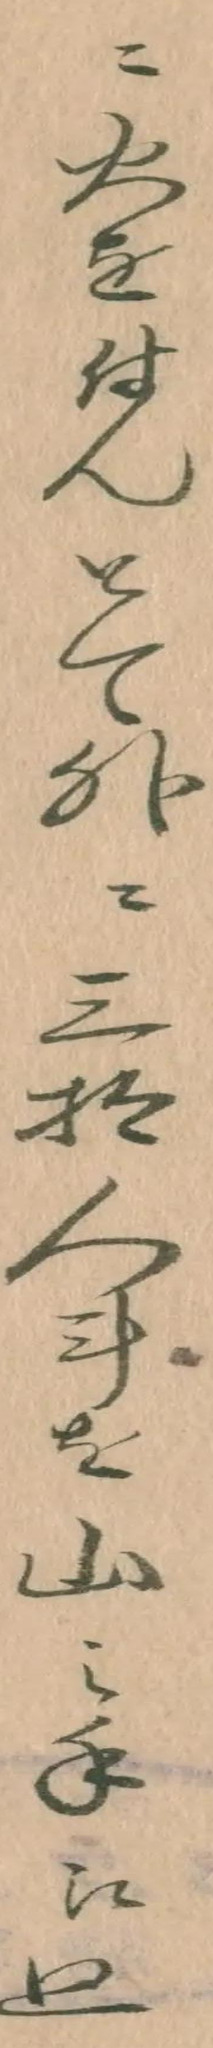に火を付んとて外に三拾人斗を山之手江廻
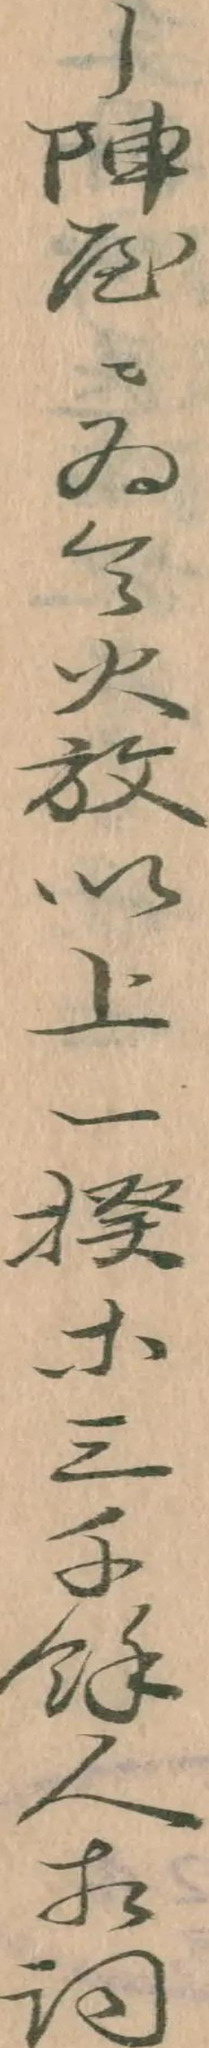し陣屋にゐ令火放以上一揆等三千余人相詞
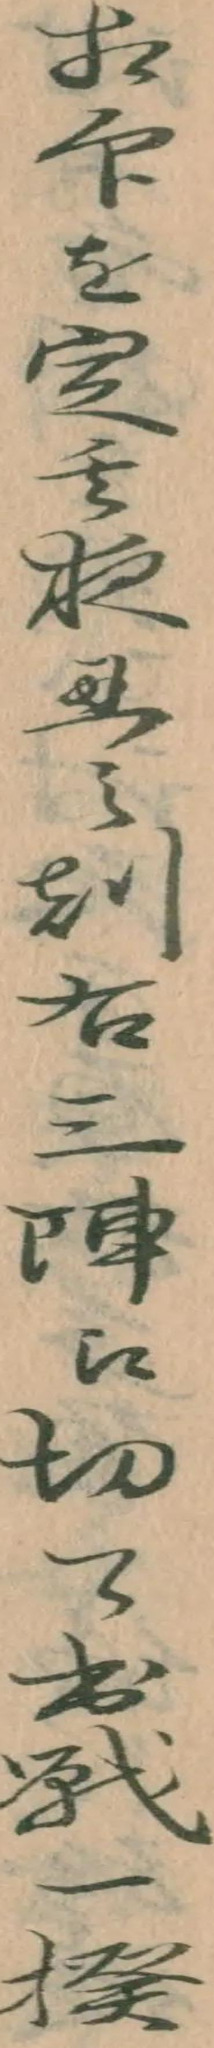相印を定其夜丑之刻右三陣江切可出戦一揆
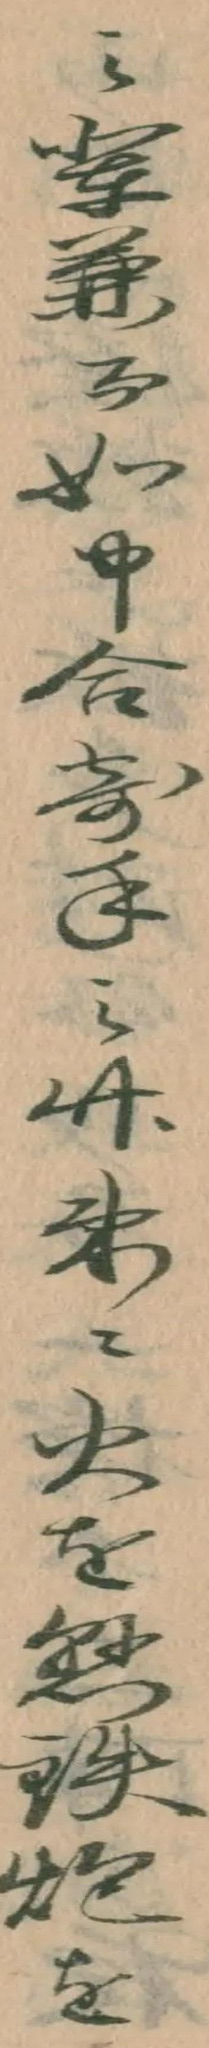之輩兼而如申合寄手之竹束に火を懸鉄炮春
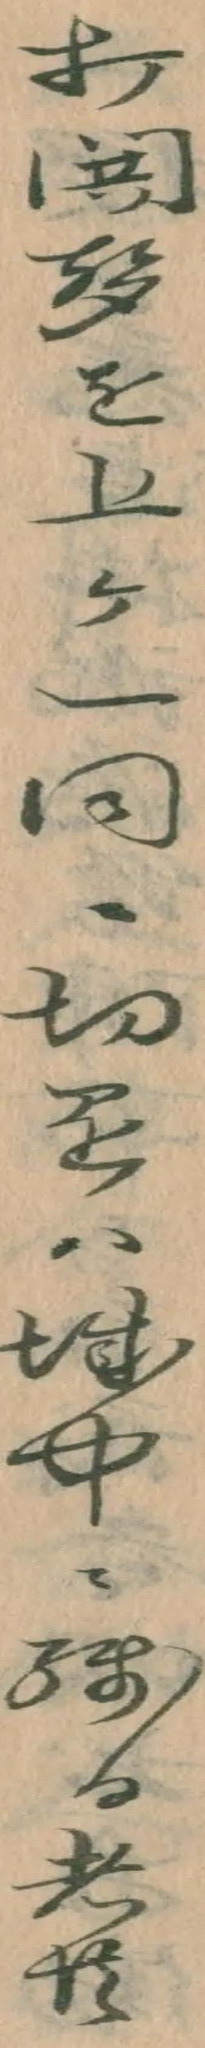打鬨声を上け一同に切懸は城中に残る者共
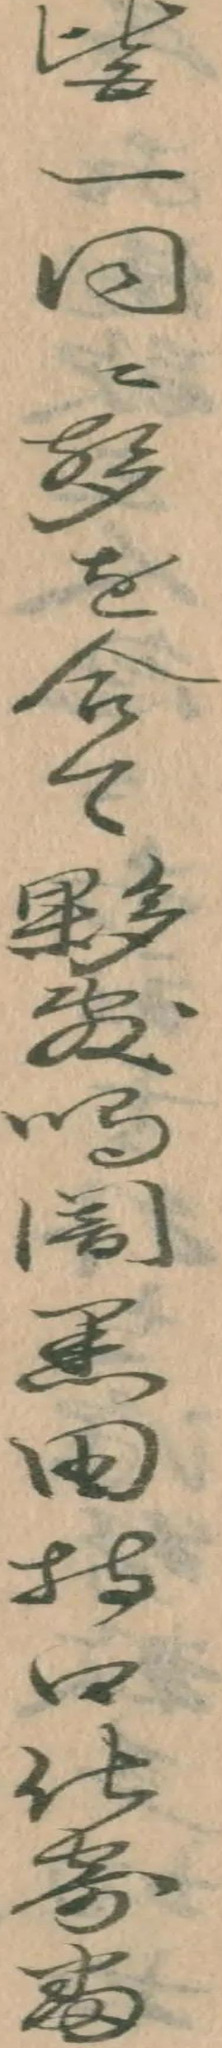皆一同に声を合て夥敷鳴闇黒田持口仕寄番
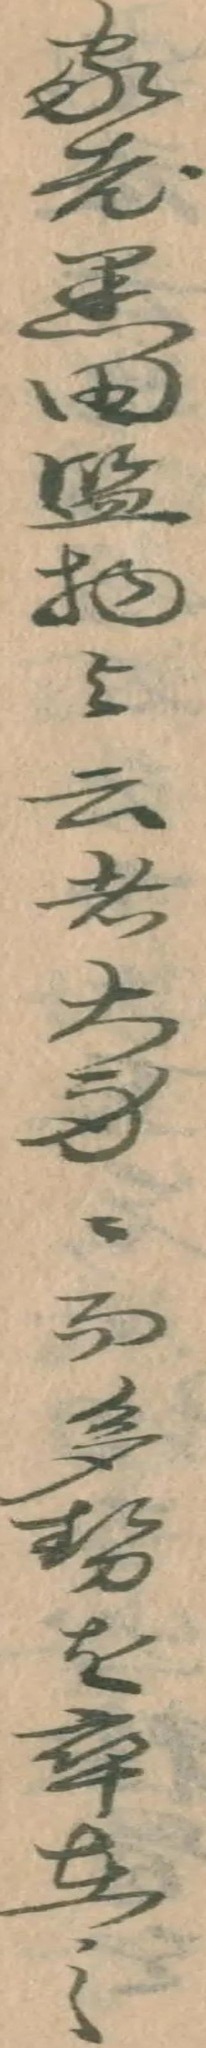家老黒田監物与云者大身に而多勢を卒在之
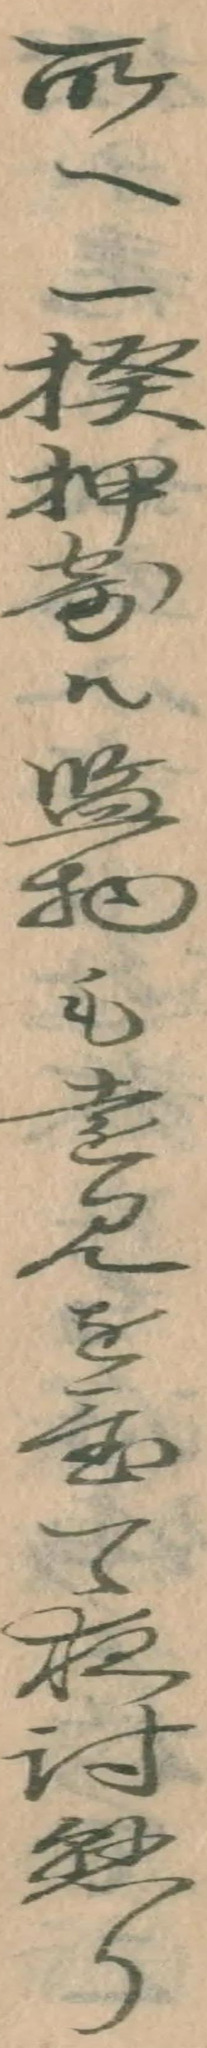所へ一揆押寄る監物も遠見を置て夜討懸り
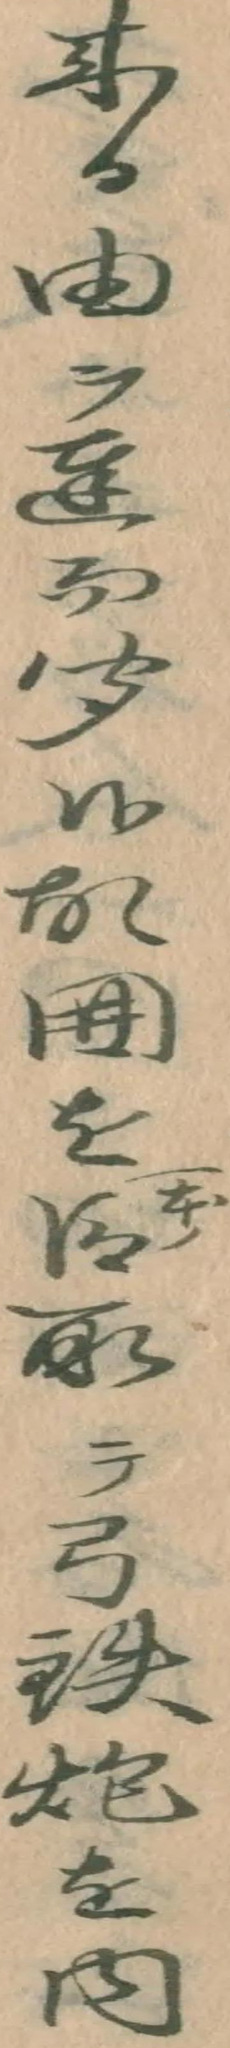来る由を達而聞候故囲を臣取て弓鉄炮を内
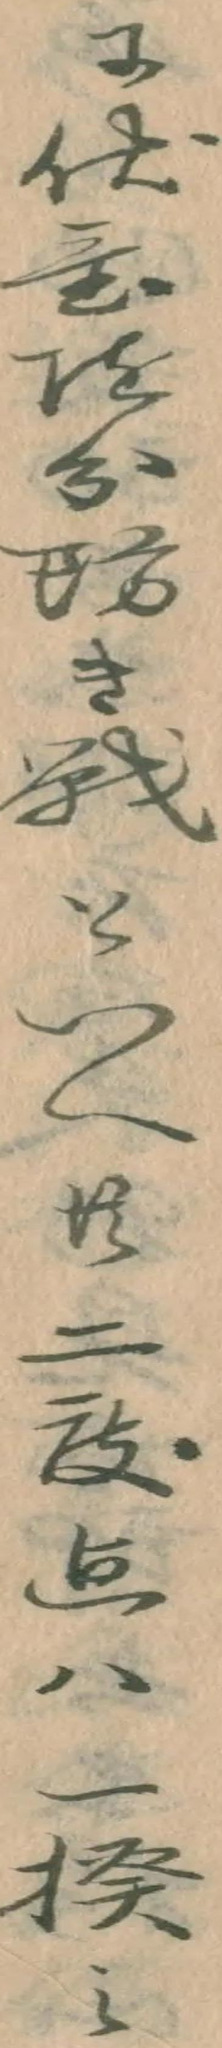尓伏置随分防き戦といへ共二度迄は一揆之
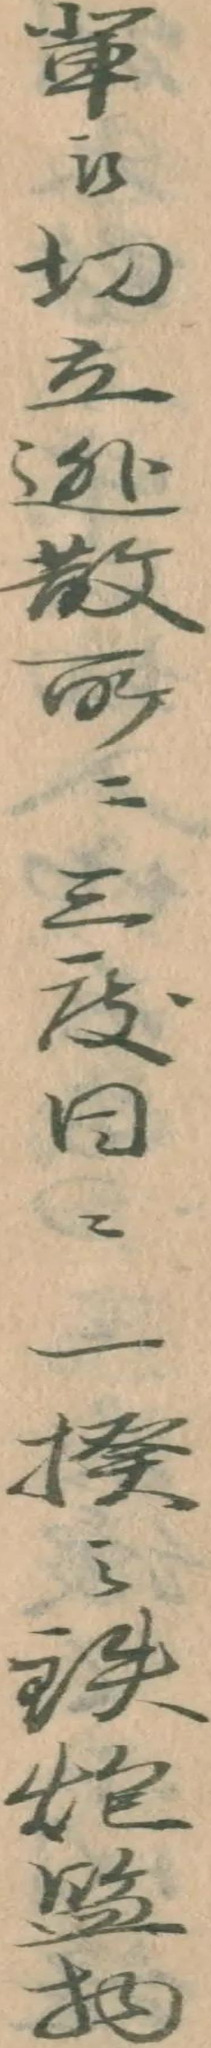輩被切立逃散所に三度目に一揆之鉄炮監物
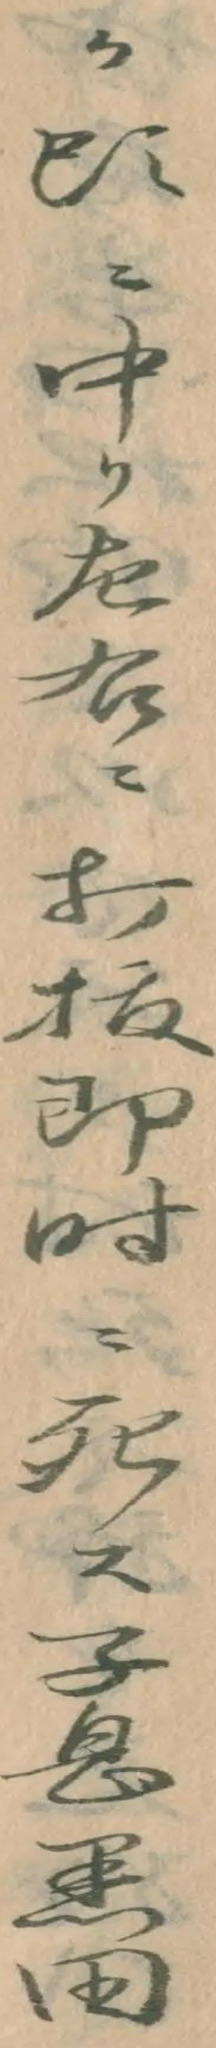か頭に中り左右に打抜即時に死す子息黒田

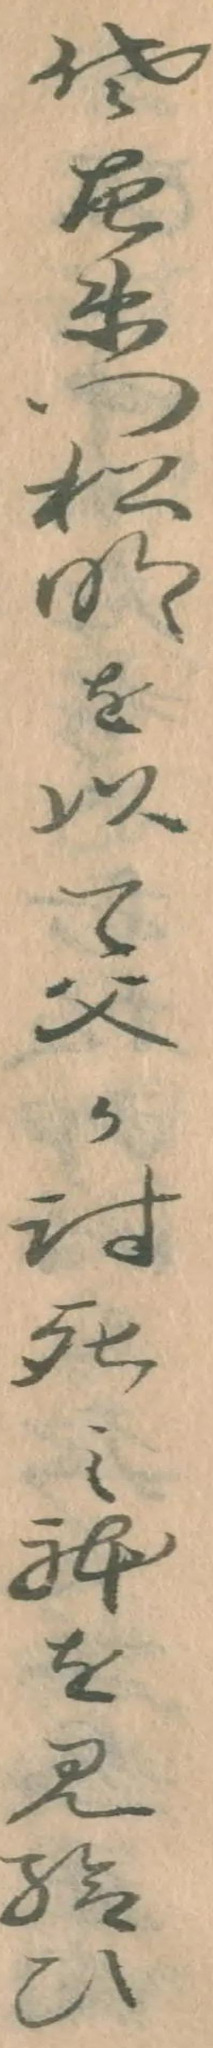佐左衛門松明を以て父か討死し躰を見給ひ
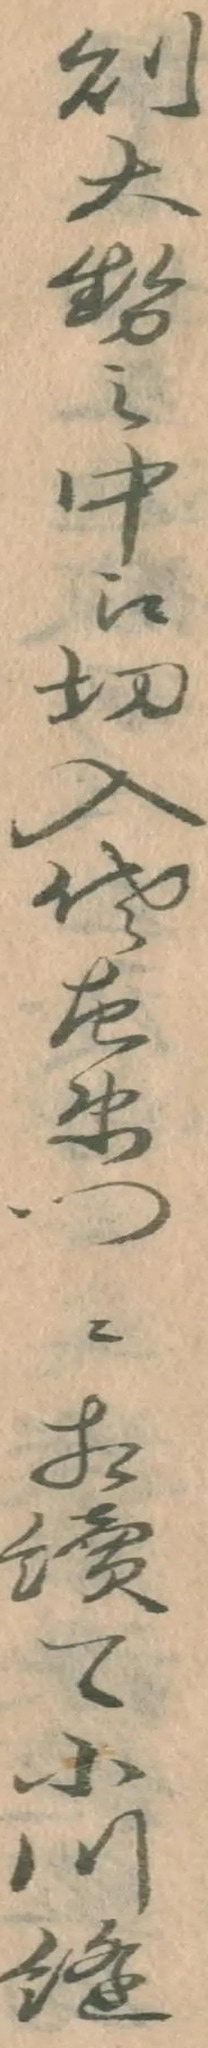即大勢之中江切入佐左衛門に相続て小川縫
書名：切支丹御退治記 49巻. [7]
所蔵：国立国会図書館 National Diet Library, JAPAN
